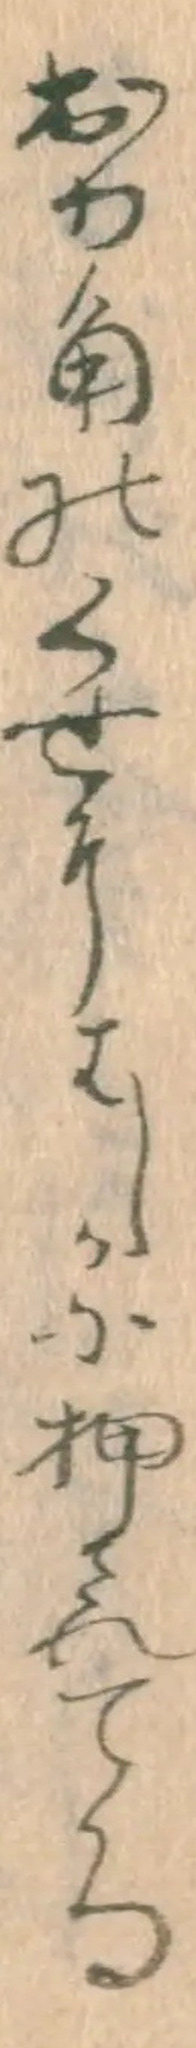お力角のくせにはしかに押されてる
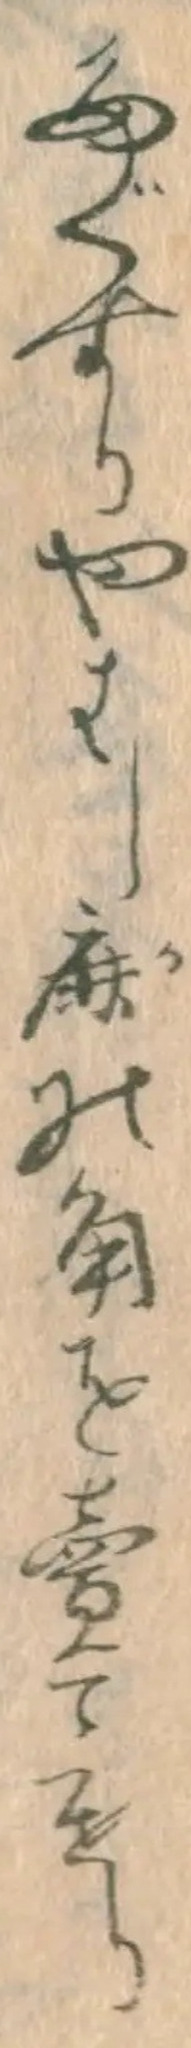たぐすりやはし鹿の角を売ており
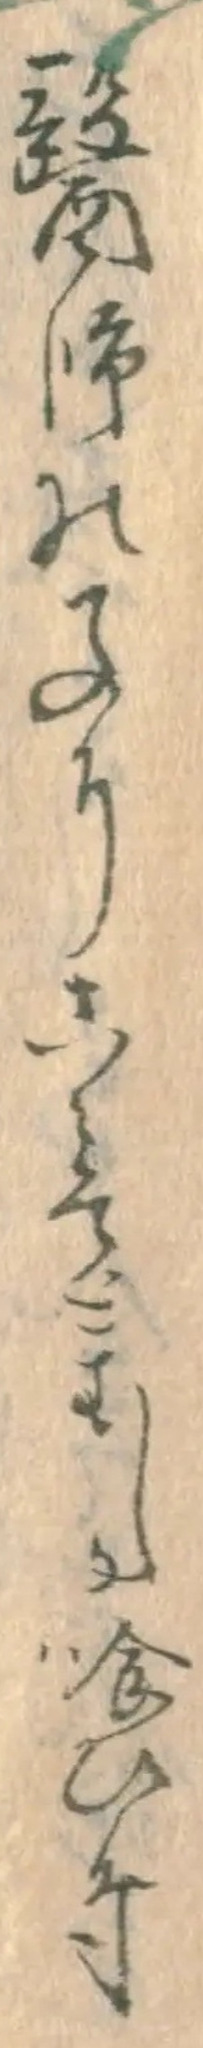医師の子にここそとはしか喰ひ付
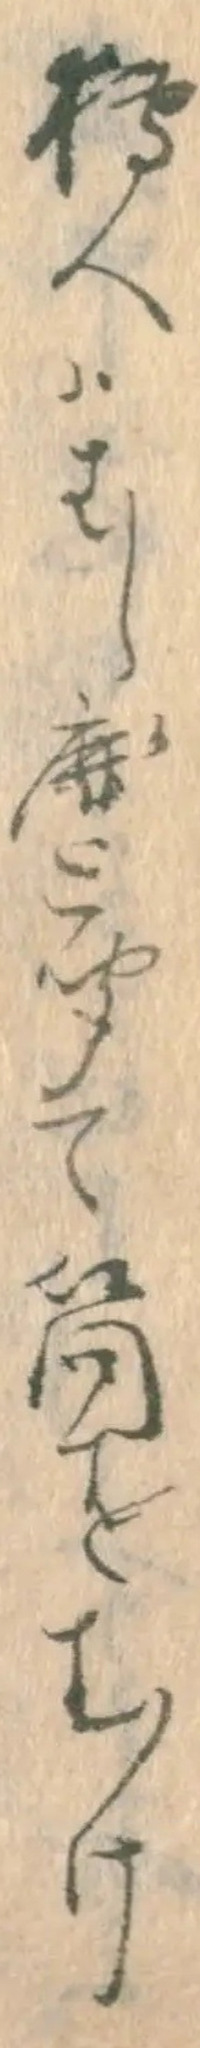狩人ははし鹿と聞て筒をむけ
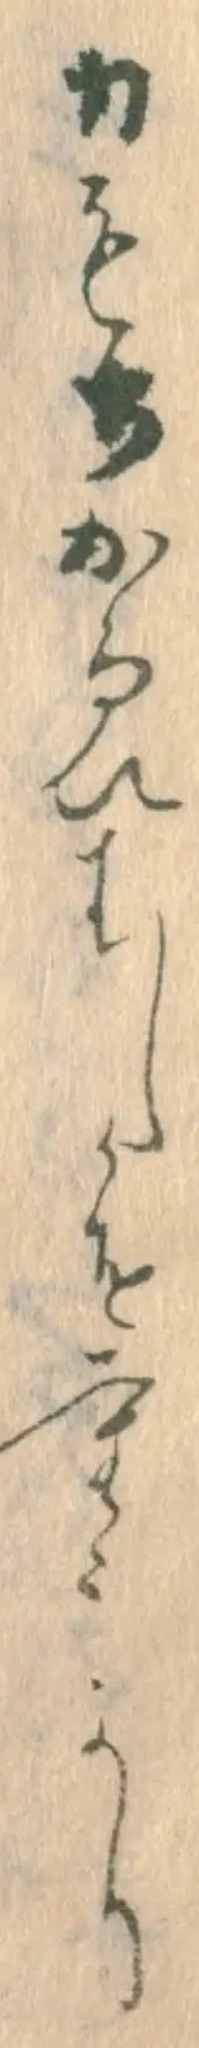力もちかるいはしかを重たかり
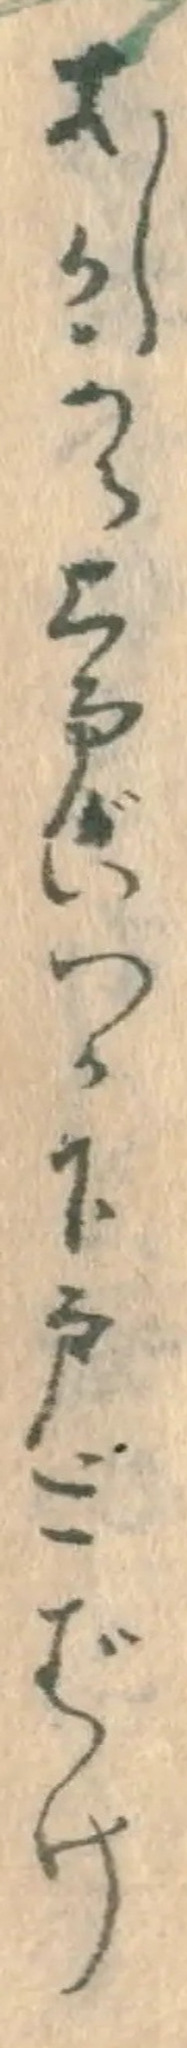はしかから上戸がいつか下戸とばけ
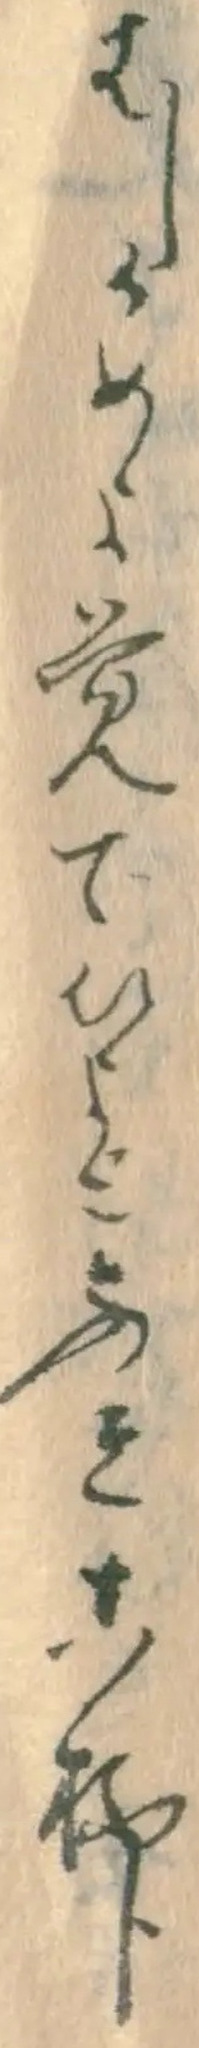はしかめよ覚ていよとふさこ郎

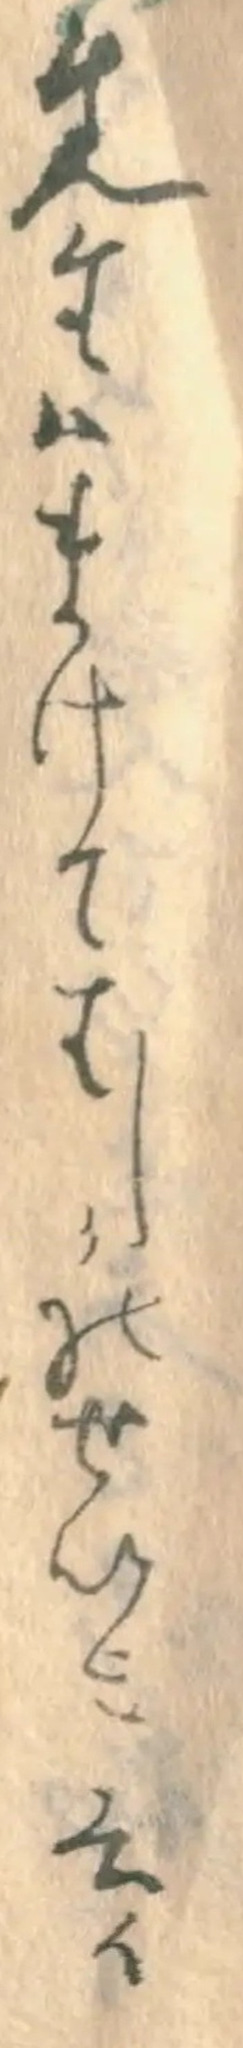先生はまけてはしかのせいと云い
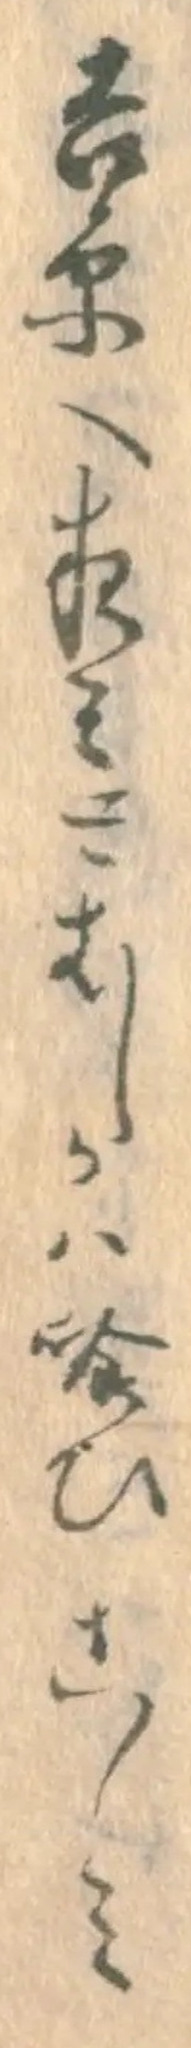吉原へ夜はとはしかは喰ひこみ
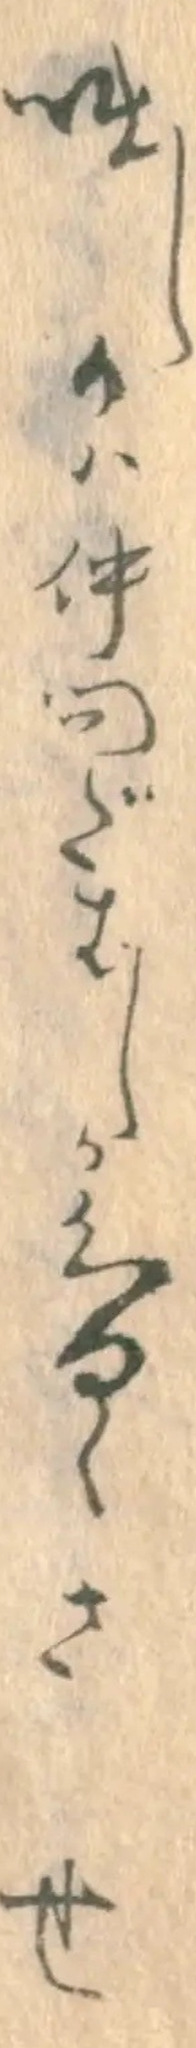咄しかは仲間だはしかかるくさせ
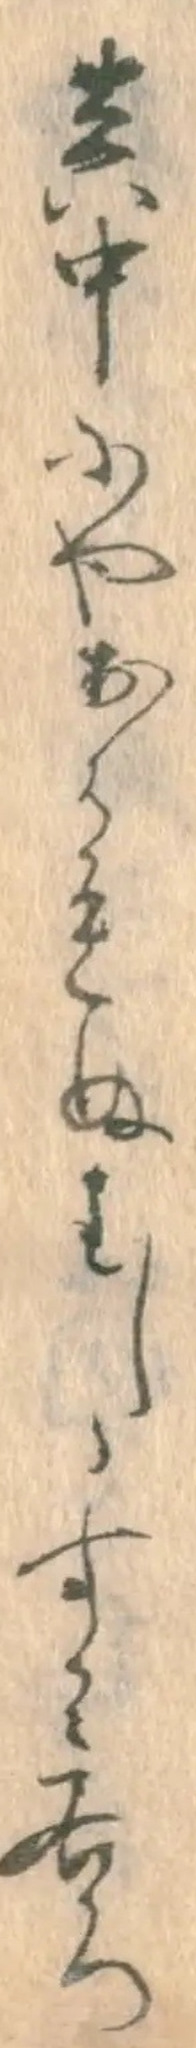真中にやおかれぬはしかすみ居り
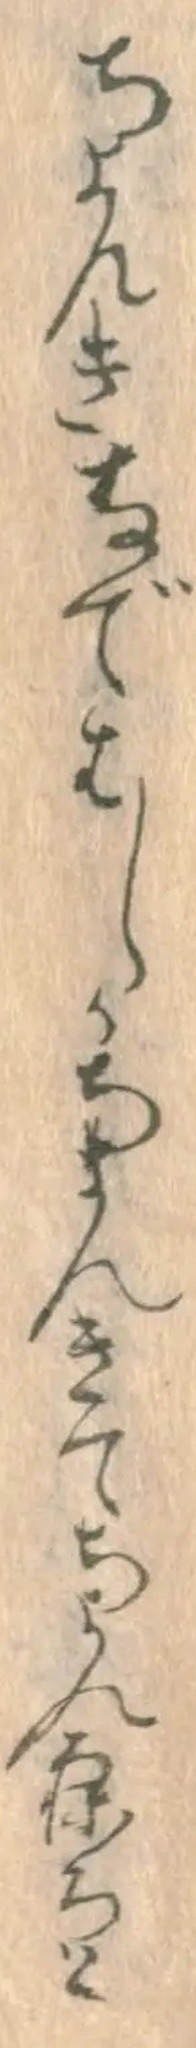ちょんきなではしかちょんきてちょん寝ろと
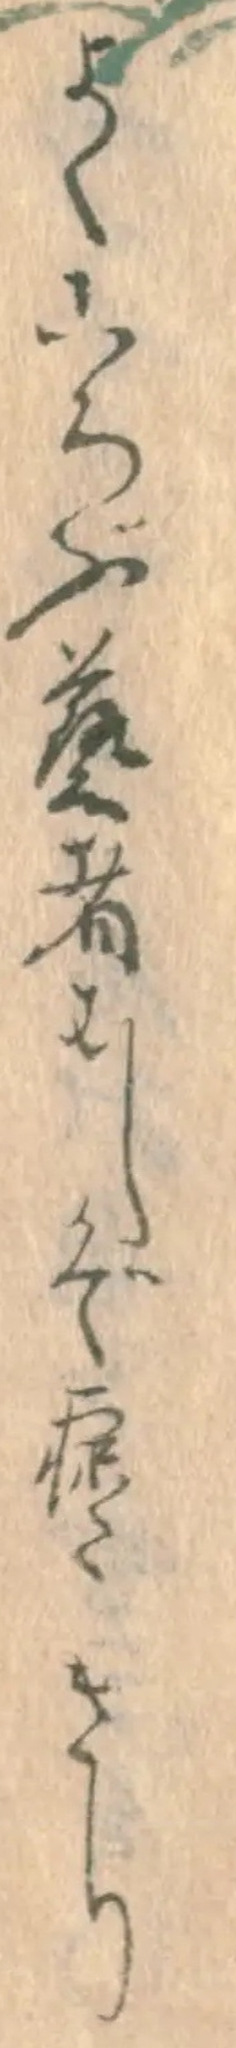よくころぶ芸者はしかで寝たきり
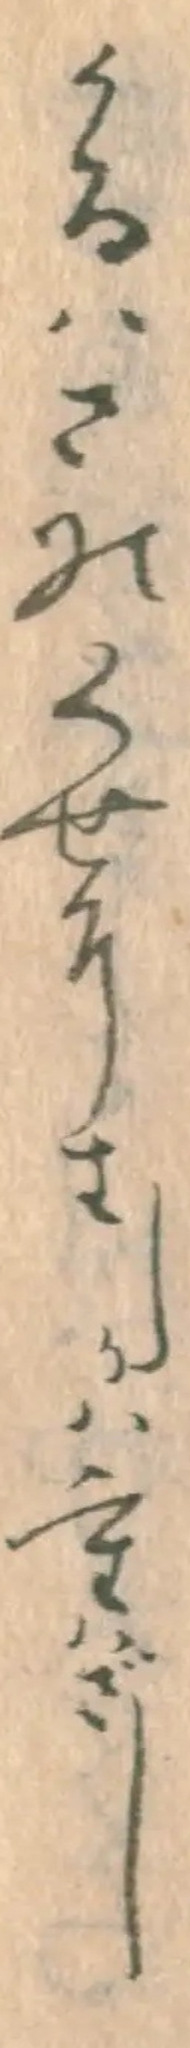かるはさのくせにはしかは重はざし
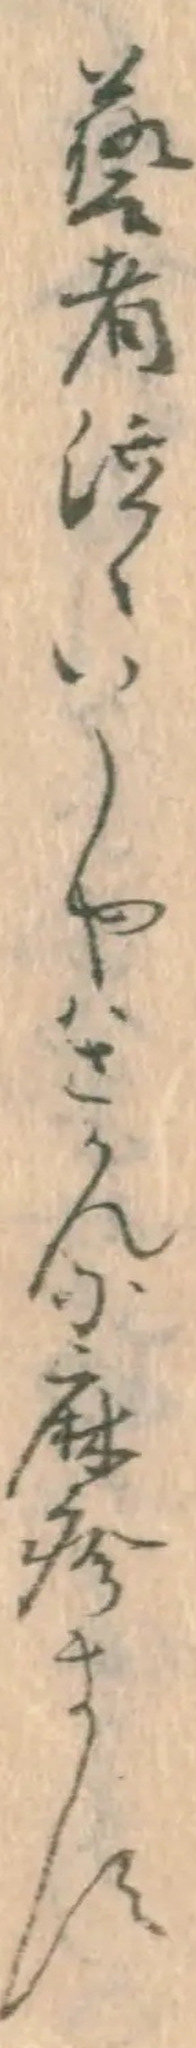芸者泣くいしゃはさかんに麻疹ます
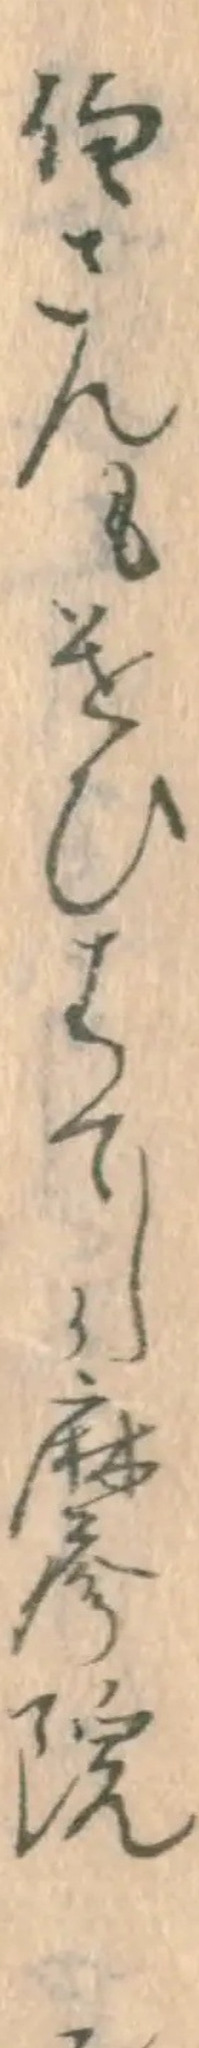僧さんも遣ひはてしか麻疹院し
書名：麻疹後柳樽
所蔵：国立国会図書館 National Diet Library, JAPAN
